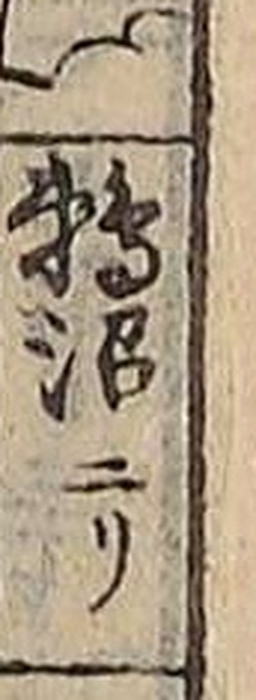鵜沼二リ
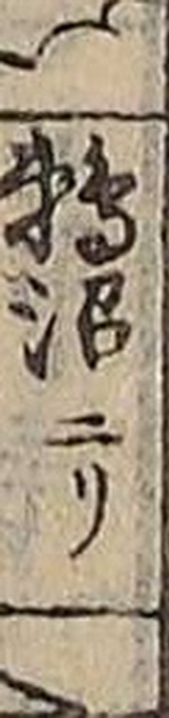鵜沼二リ
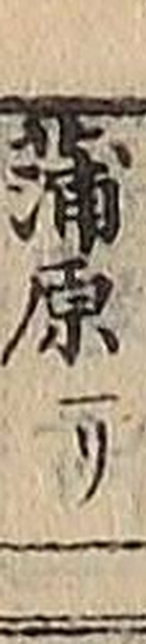蒲原一リ
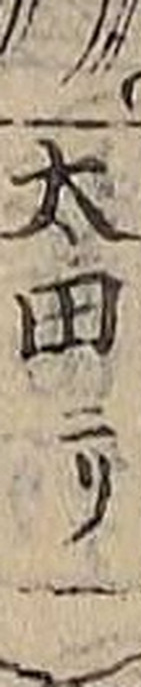太田二リ
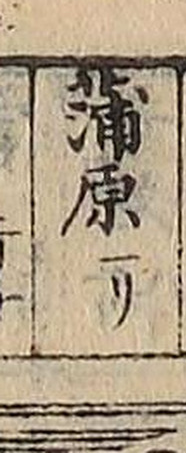蒲原一リ
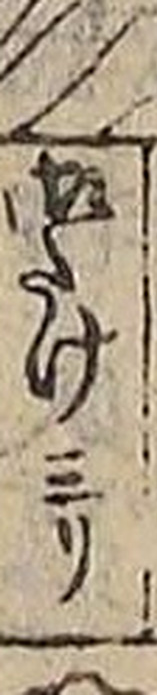御たけ三リ

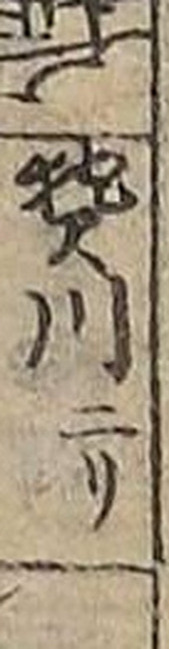贄川二リ
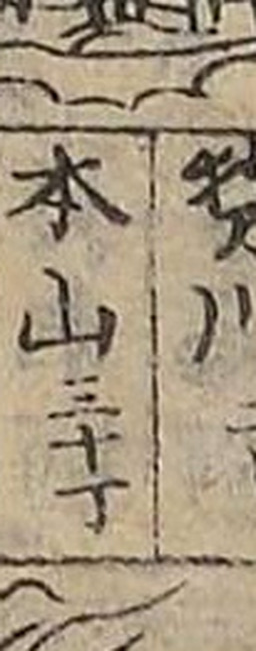本山三十丁
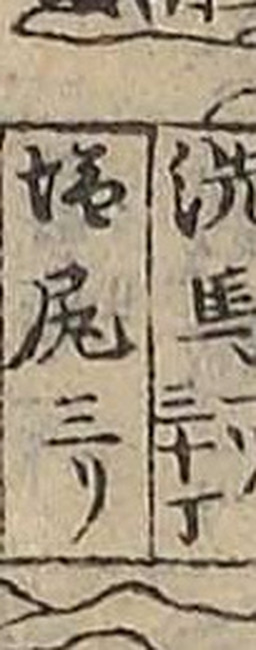塩尻三リ
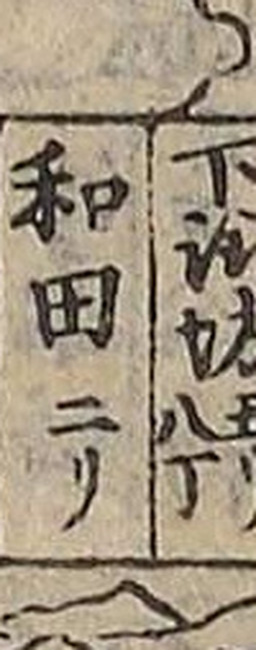和田二リ
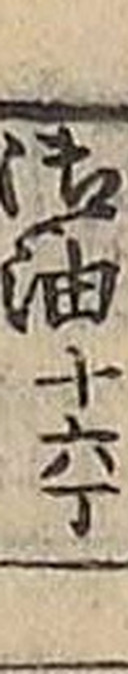御油十六丁
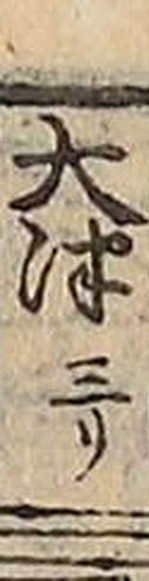大津三リ
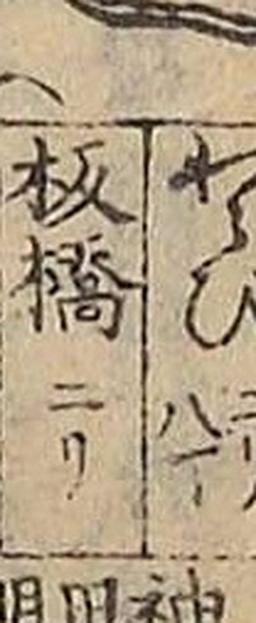板橋二リ
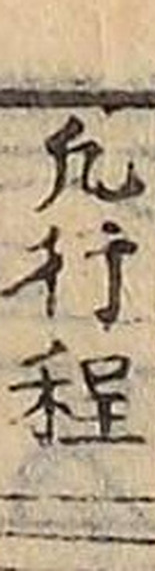凡行程
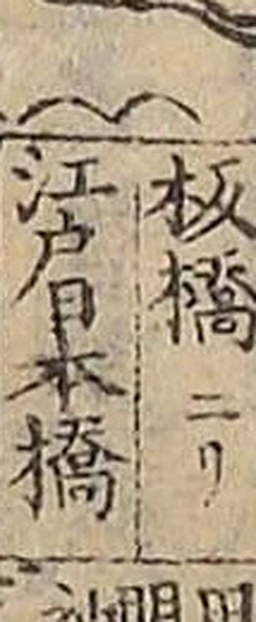江戸日本橋
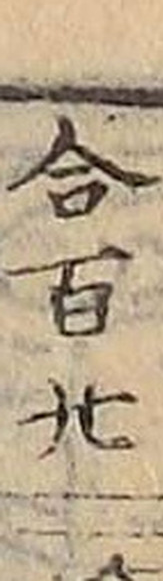合百廿
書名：旅行用心集
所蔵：神戸大学附属図書館 国文学研究資料館
